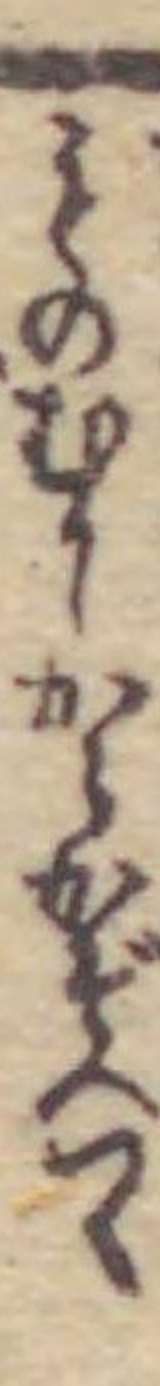ことのむかしからかぞへつく
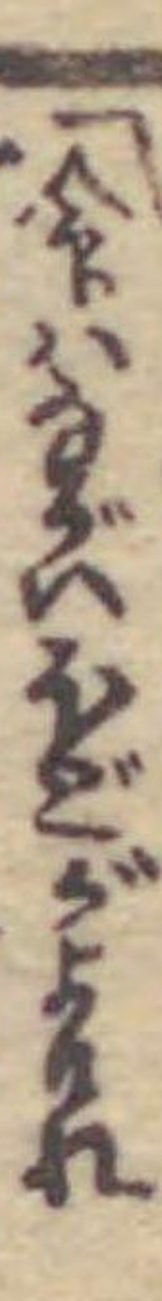〽命はながいほどがよけれ
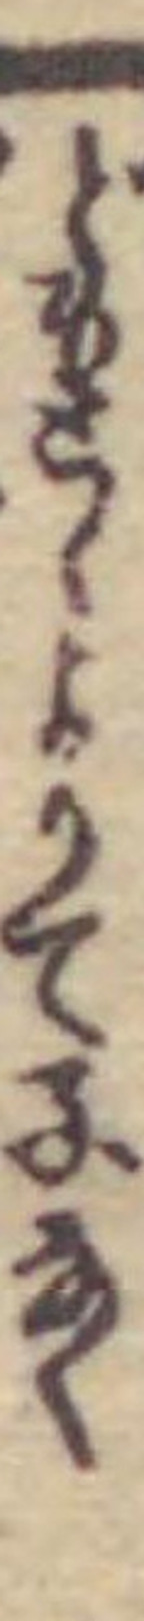どもとしよりて子なく
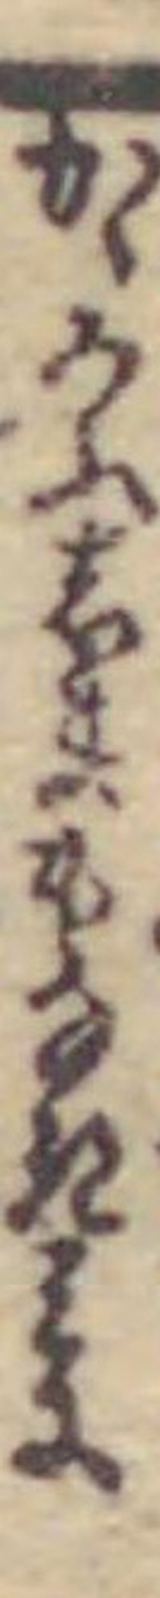かゝろふしまもなきみに
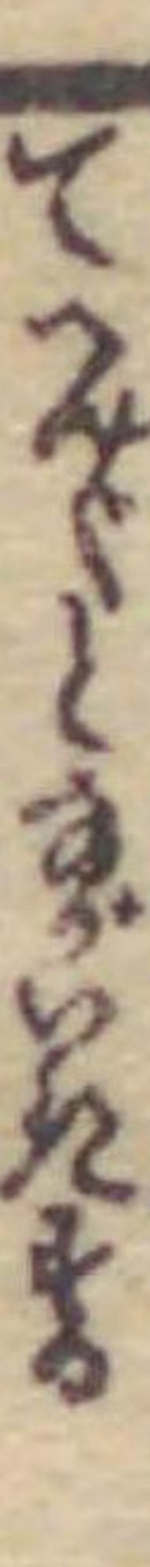てつけ〴〵とながいきする
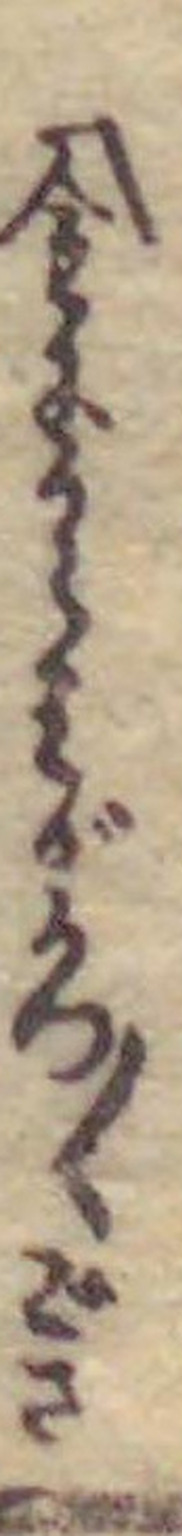〽金にからみがかつ〳〵ごさ
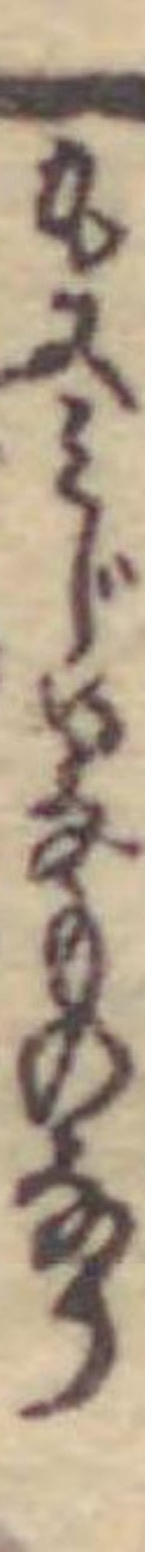も又みじめなものなり
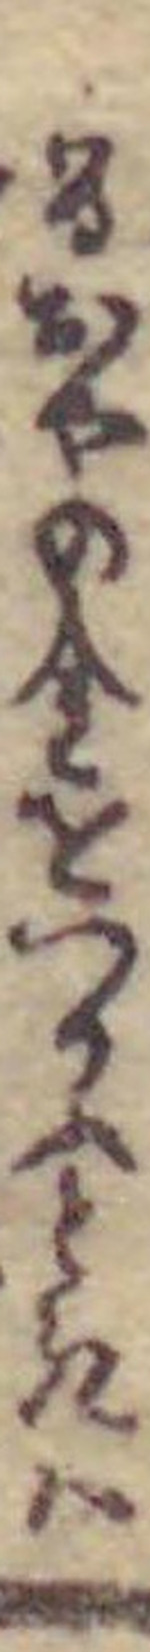るおやの金をつかふときは
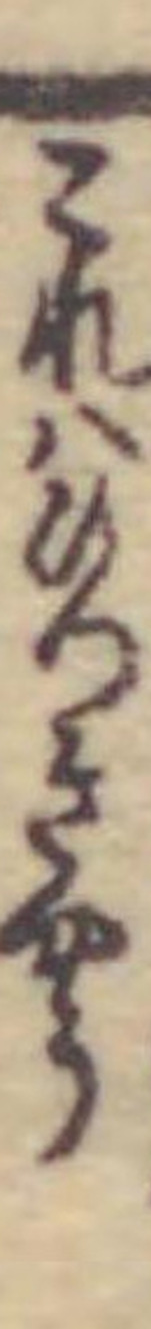これはひつきやう
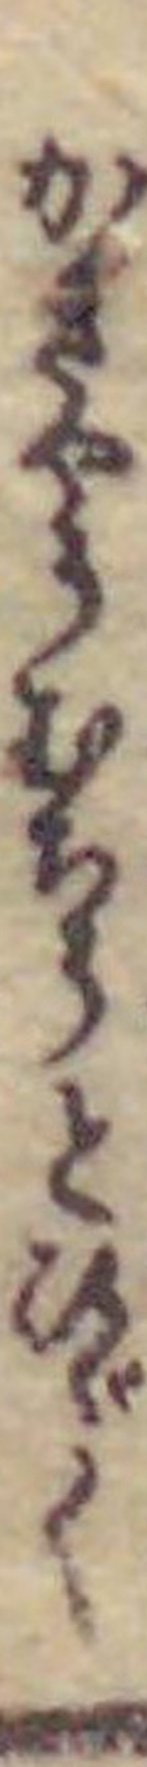かきやうむちうとひゞく
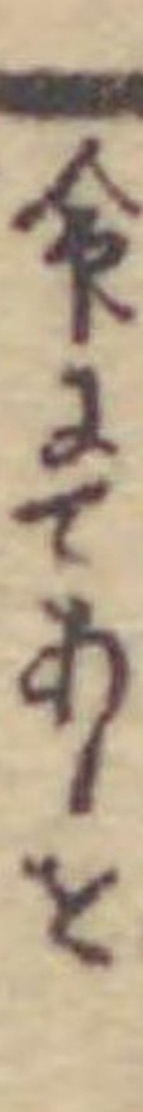命にてあしを
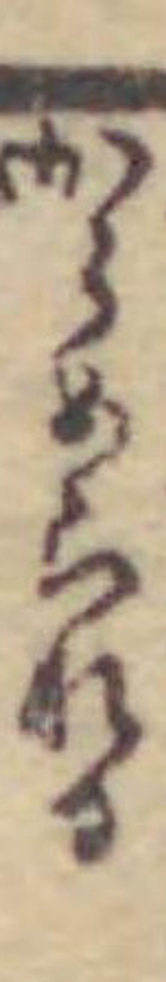からめられる
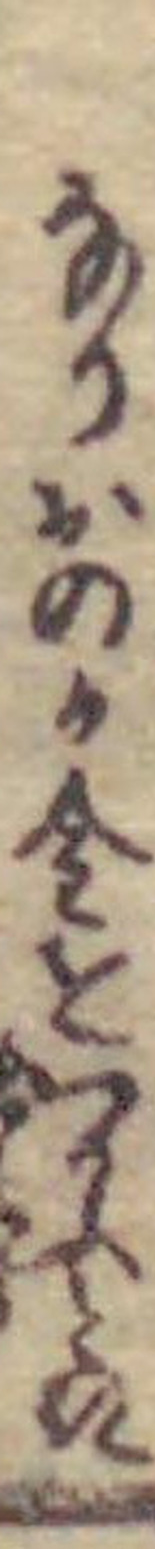なりおのか金をつかふとき
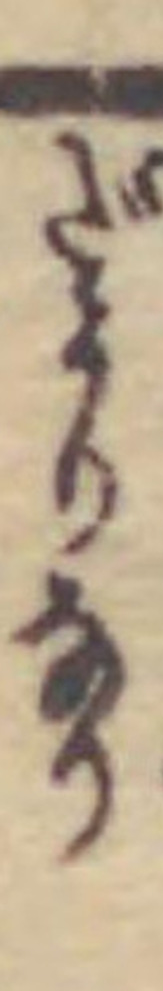だうりなり
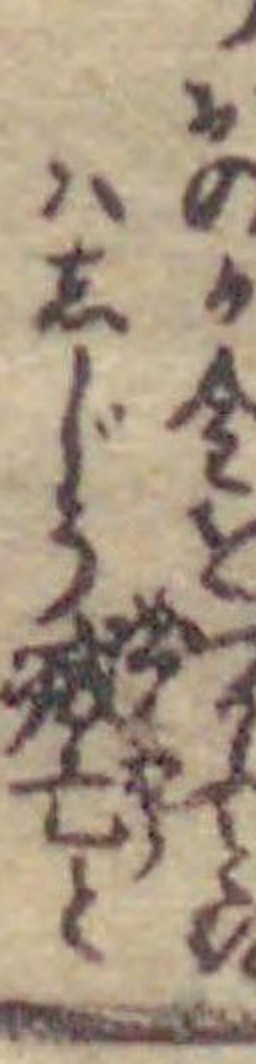はしじう滅亡と
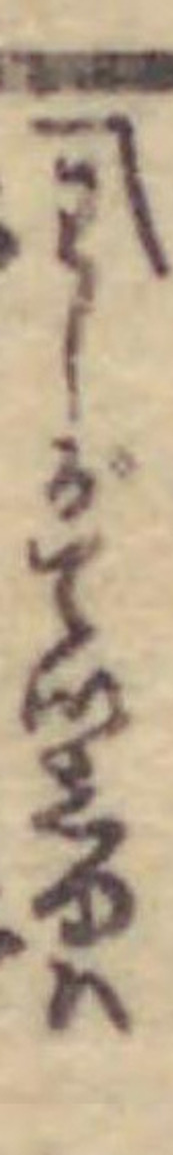〽わしがていしゆは
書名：御誂染長寿小紋 : 3巻
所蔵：国立国会図書館 National Diet Library, JAPAN
